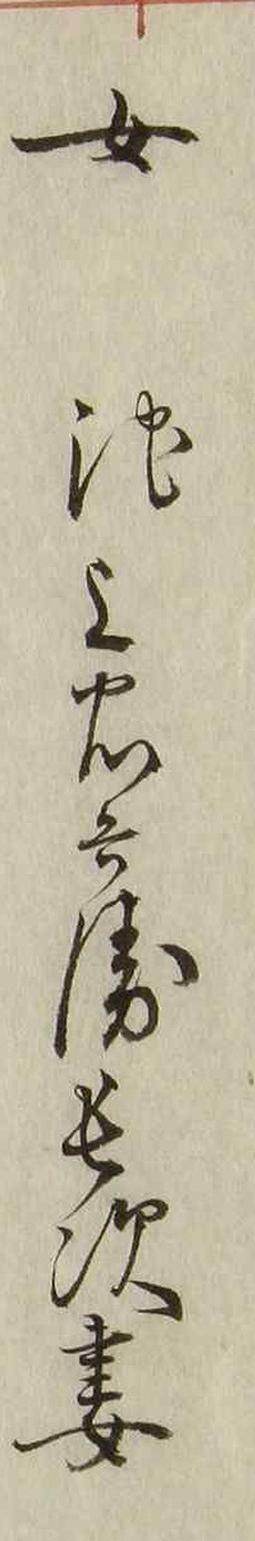女池上忠兵衛長次妻
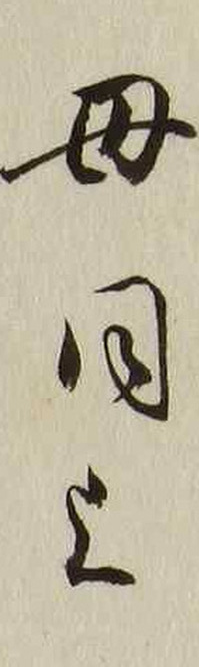母同上
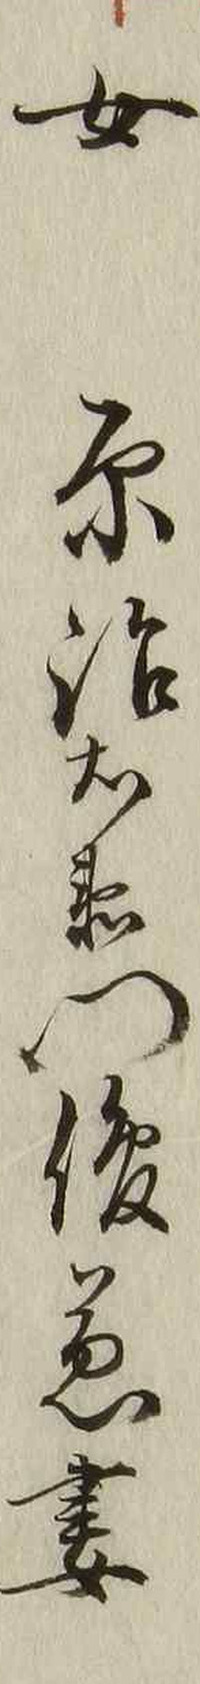女原治右衛門俊兼妻
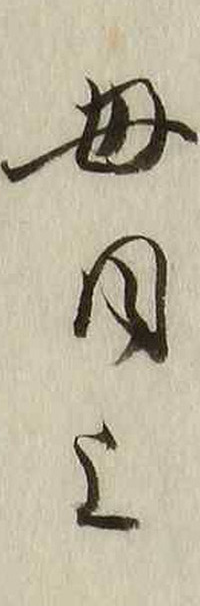母同上
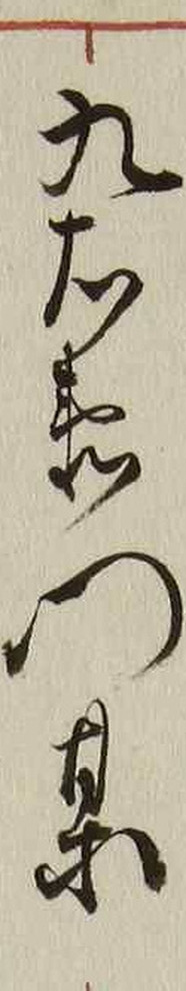九右衛門某
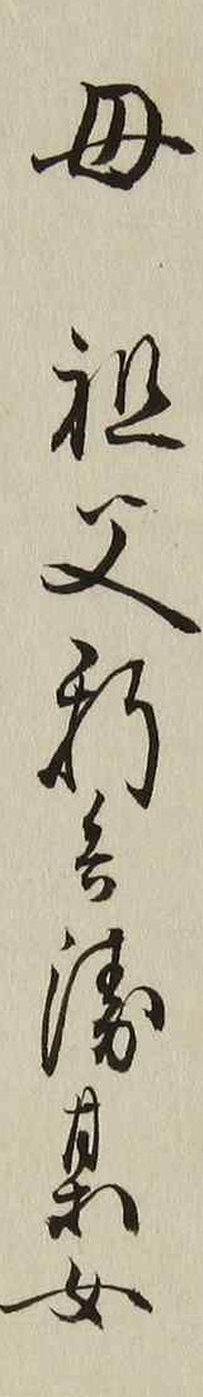母祖父新兵衛某女
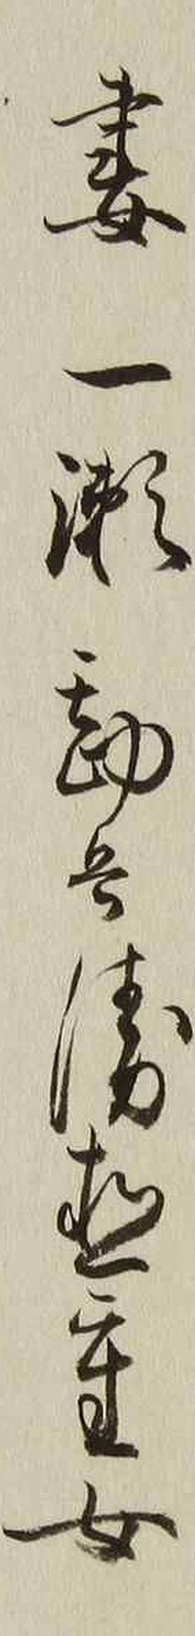妻一瀬勘兵衛直重女
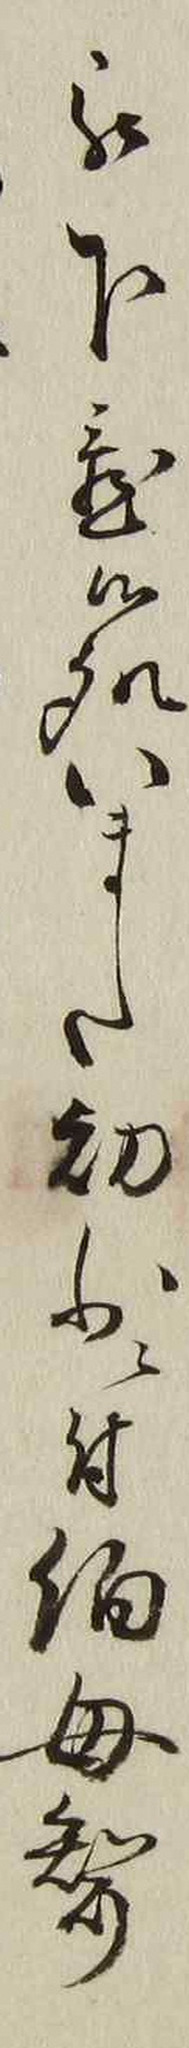被下置候処いまた幼少ニ付伯母婿
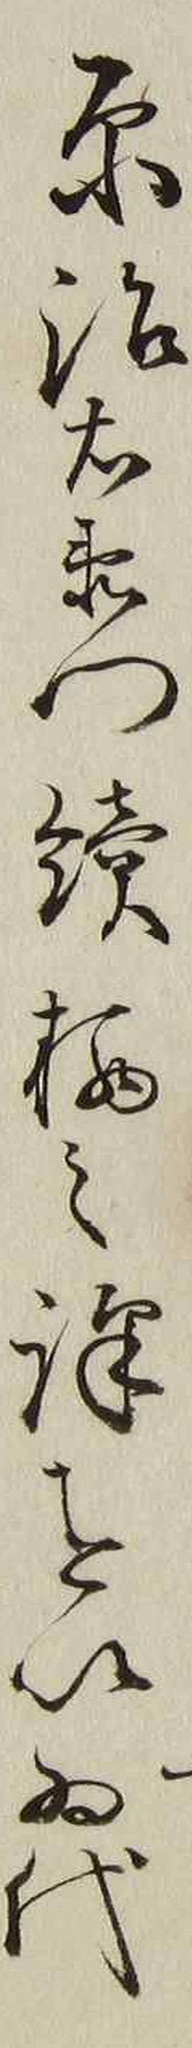原治右衛門続柄之訳を以為代
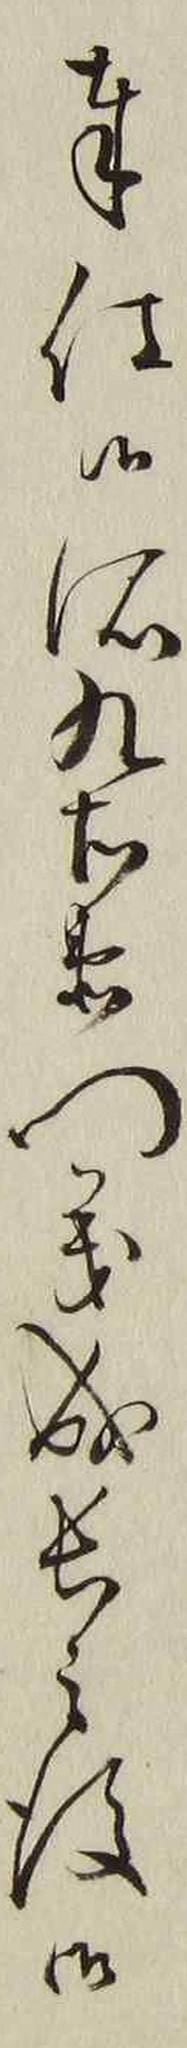奉仕候所九右衛門義成長之儀御
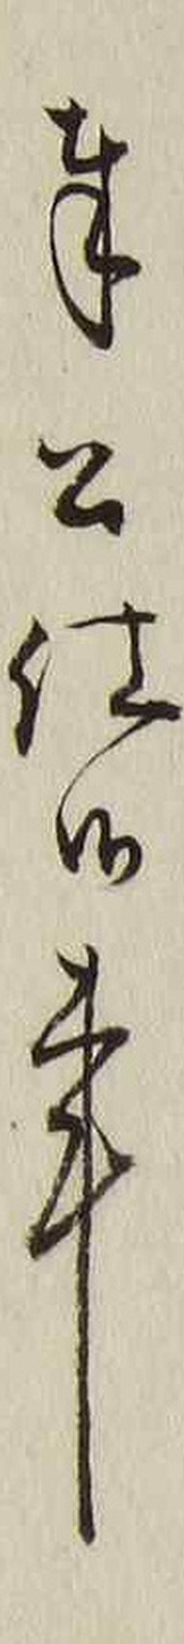奉公仕候事
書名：諸士系譜　巻之45　は之部13
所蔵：会津若松市立会津図書館
